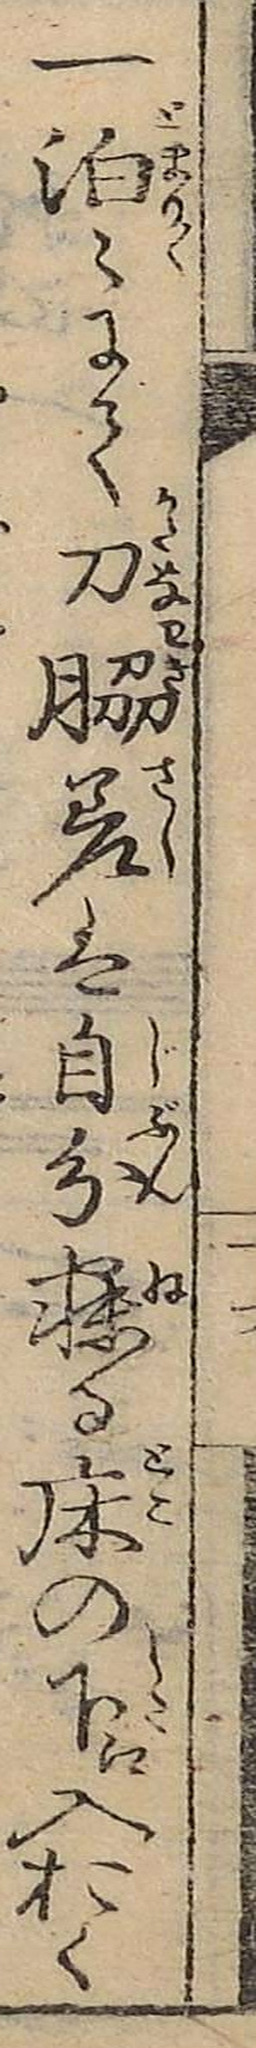一泊々にて刀脇差は自分寐る床の下入おく
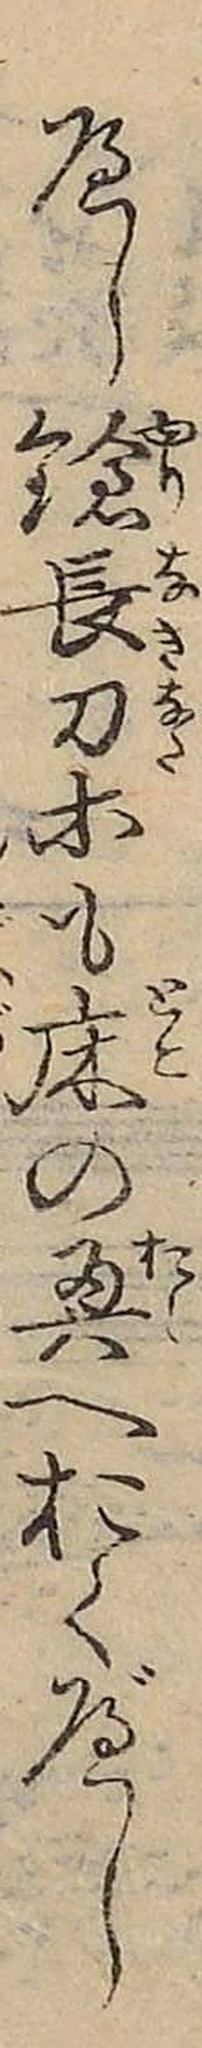へし鎗長刀等も床の奥へおくべし
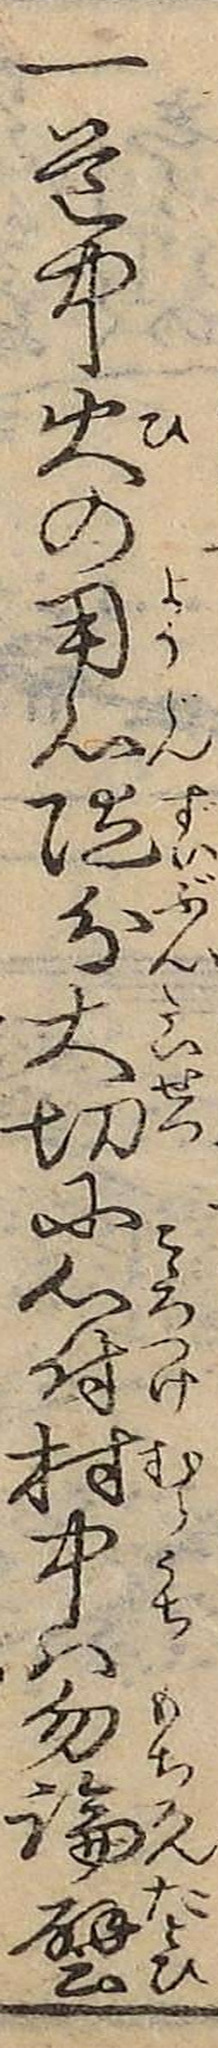一道中火の用心随分大切に心付村中は勿論譬
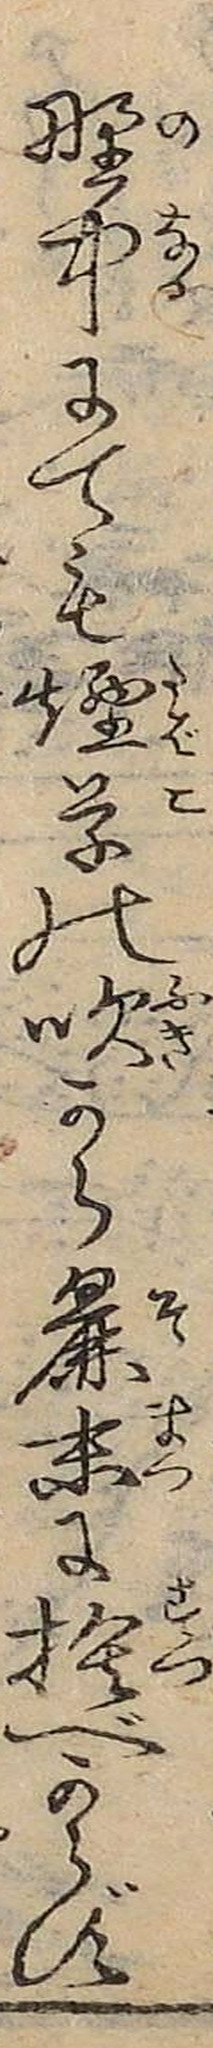野中にても煙草の吹から麁末に捨べからず
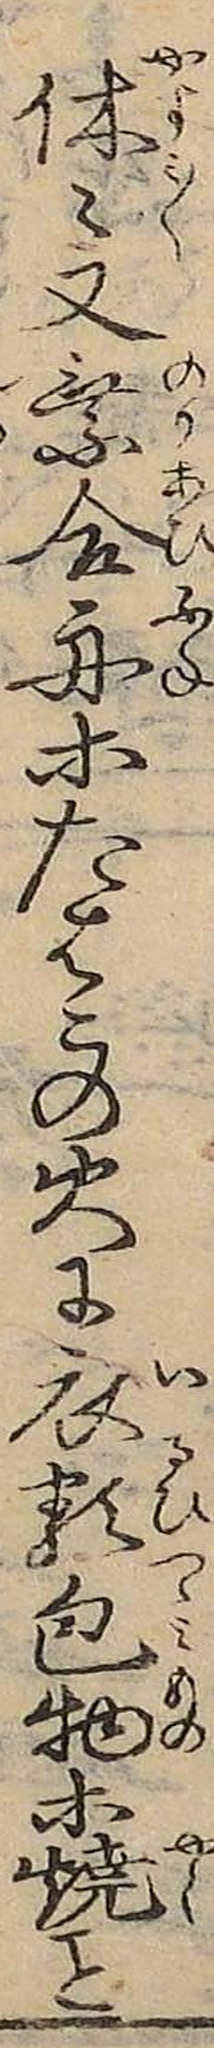休々又乗合舟等たはこの火に衣類包物等焼こと
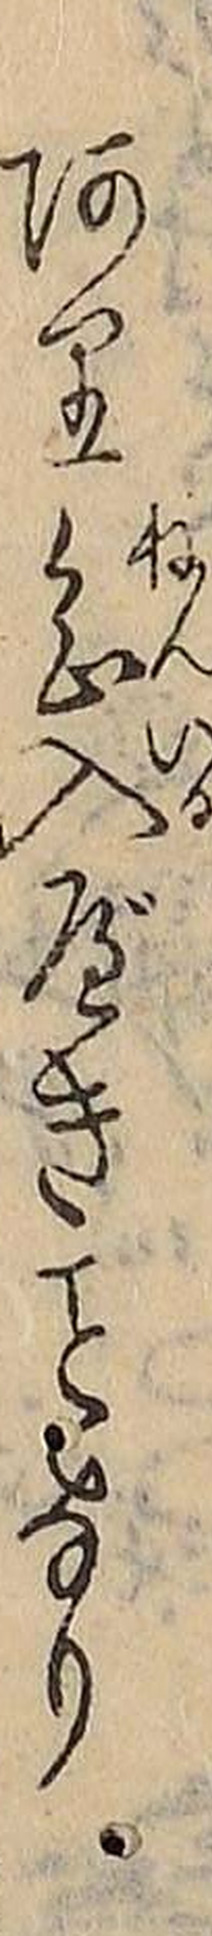あり念入べきことなり
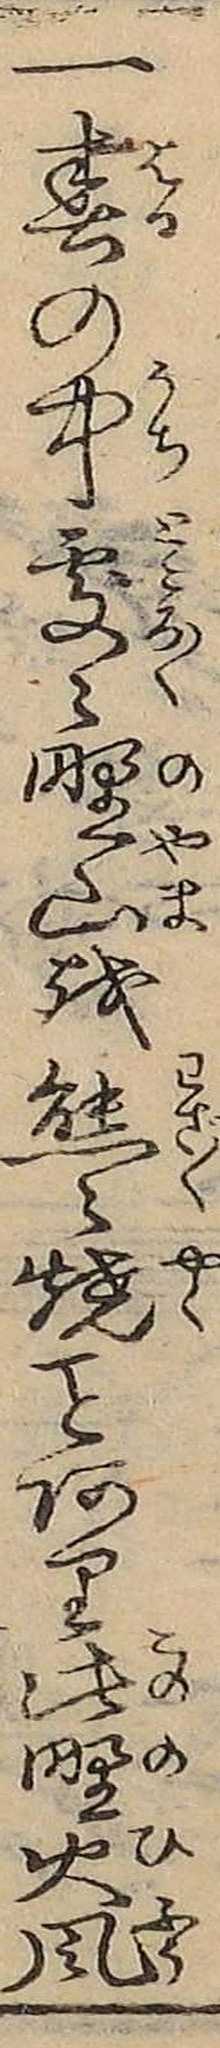一春の中処々野山を態々焼ことあり此野火風
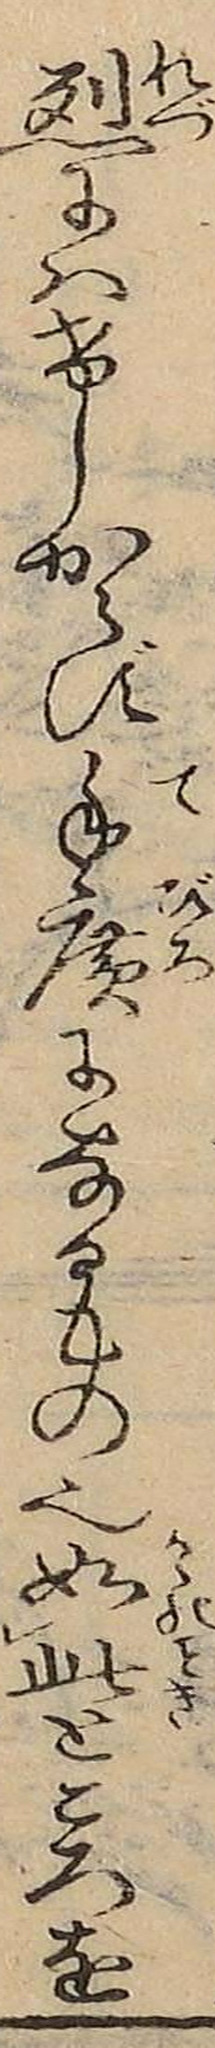烈にはけしからず手広になるもの也如此ところを
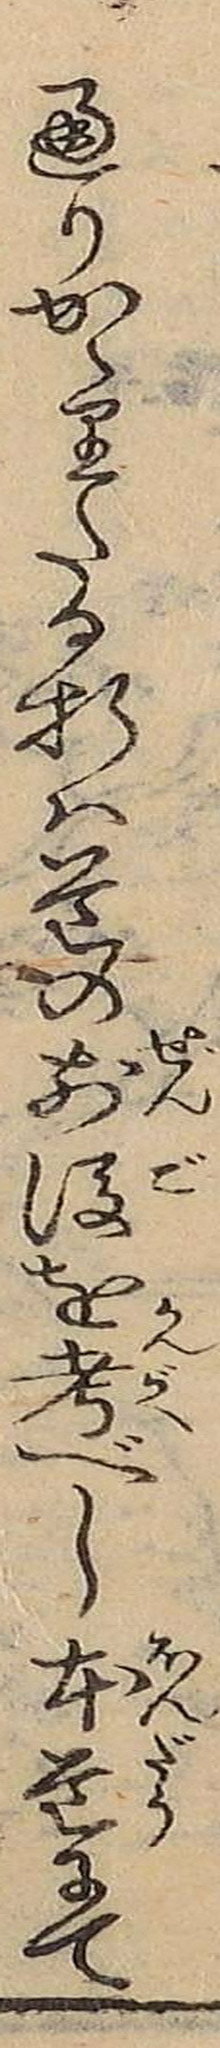通りかゝりたる折は道の前後を考べし本道にて
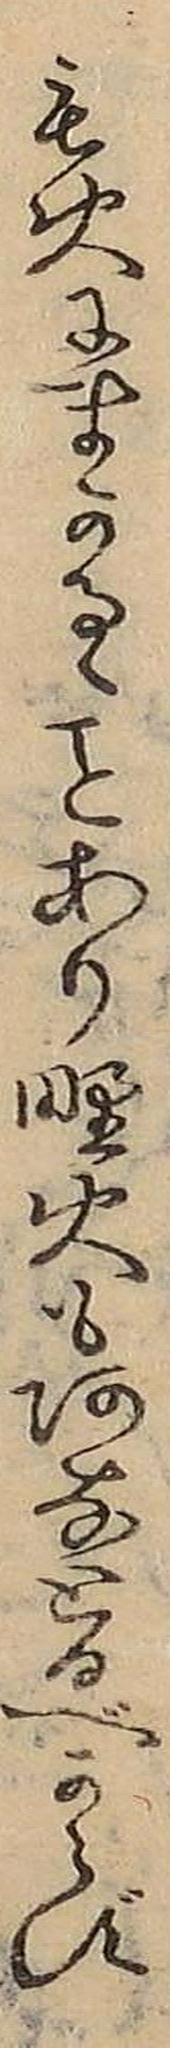も火にまかるゝことあり野火もあなとるべからず
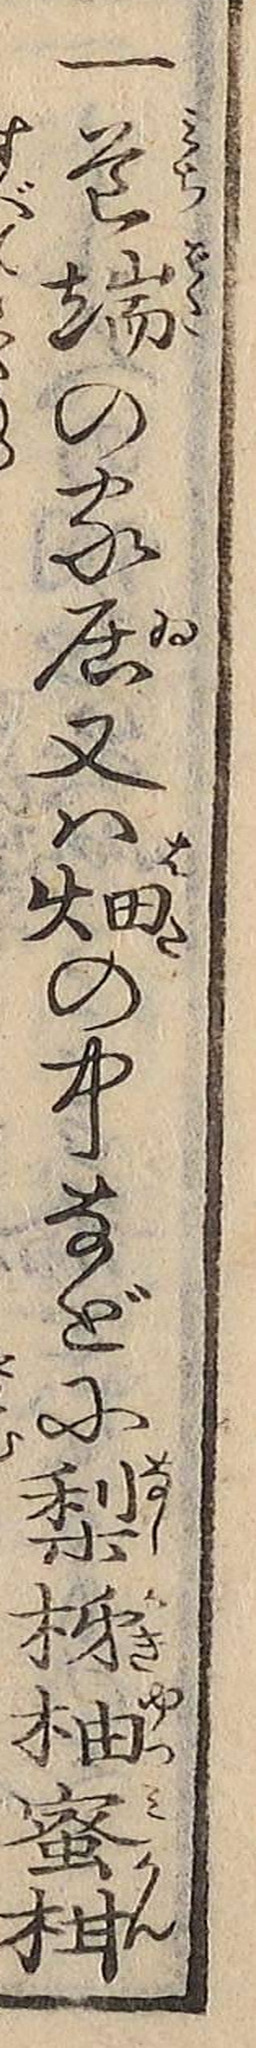一道端の家居又は畑の中などに梨柿柚蜜柑
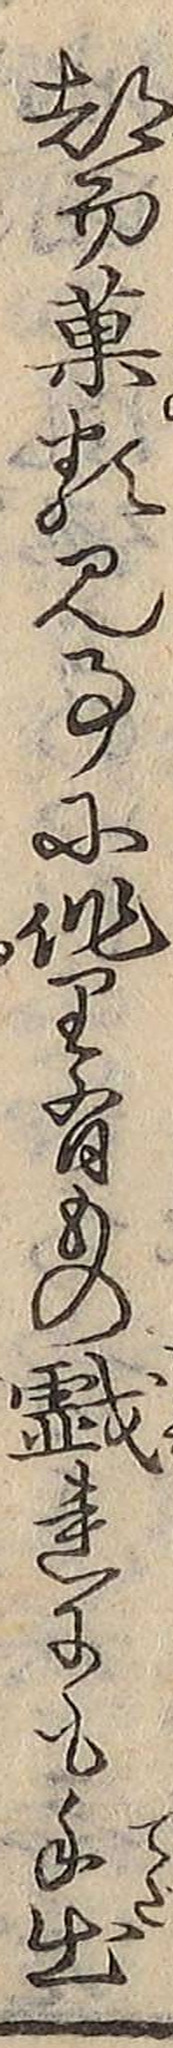都而菓類見事に作り有もの戯れにも手出
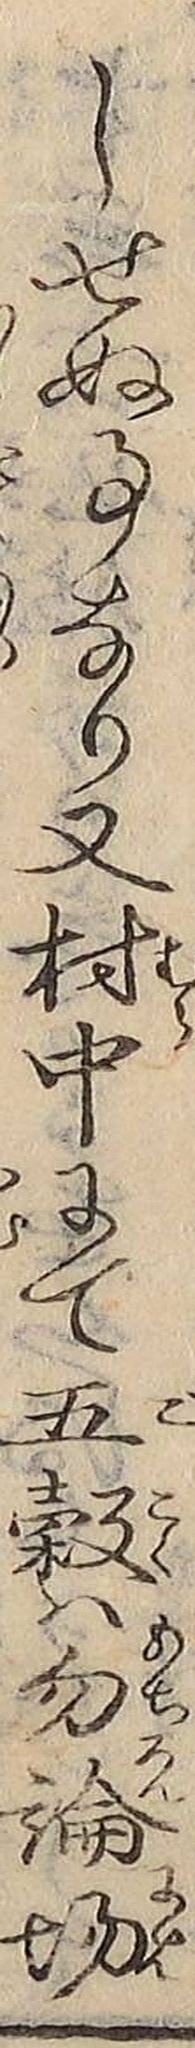しせぬ事なり又村中にて五穀は勿論場
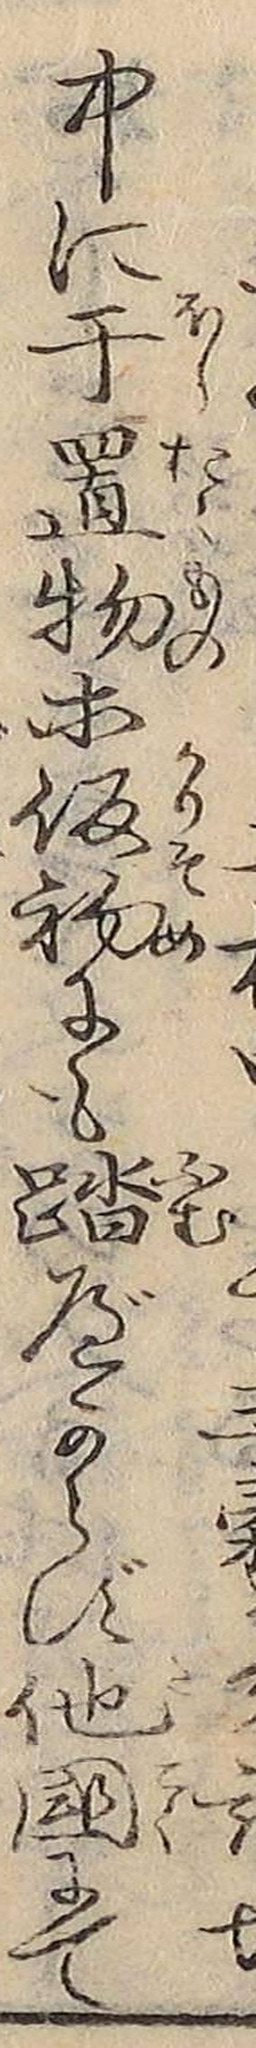中に干置物等仮初にも踏べからず他国にて
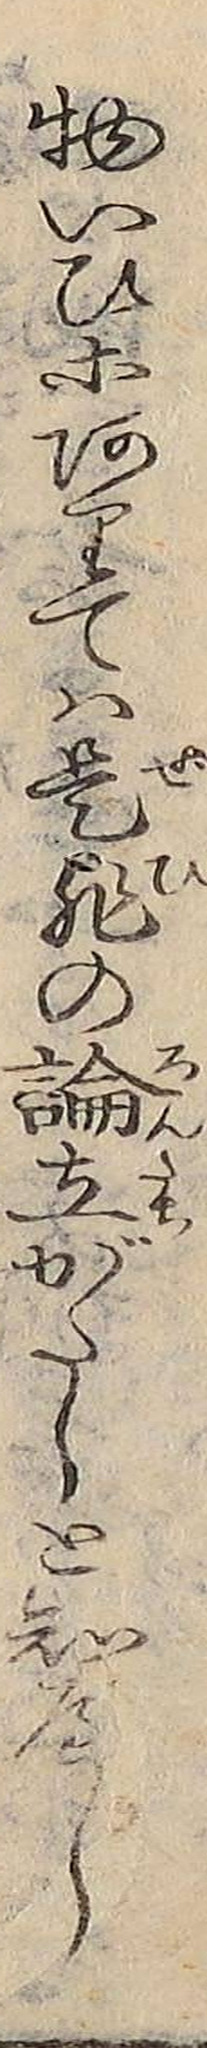物いひ等ありては是非の論立がたしと知へし
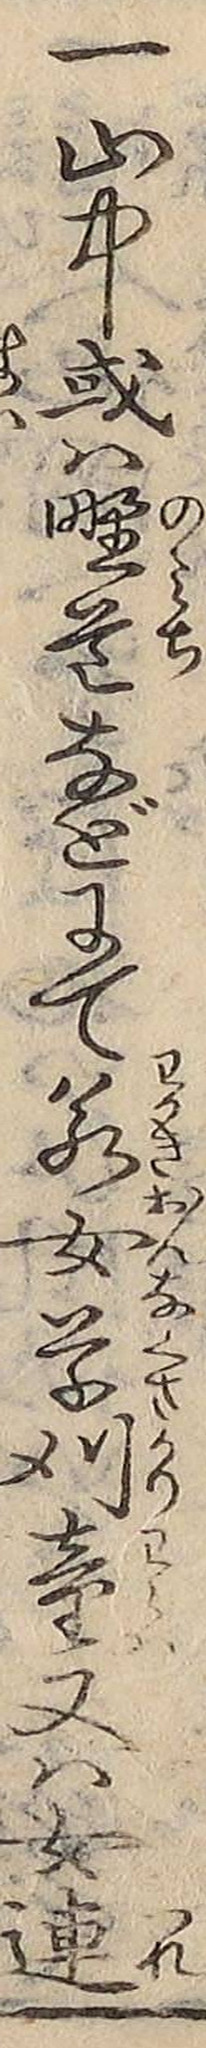一山中或は野道などにて若女草刈童又は女連
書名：旅行用心集
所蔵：神戸大学附属図書館 国文学研究資料館
